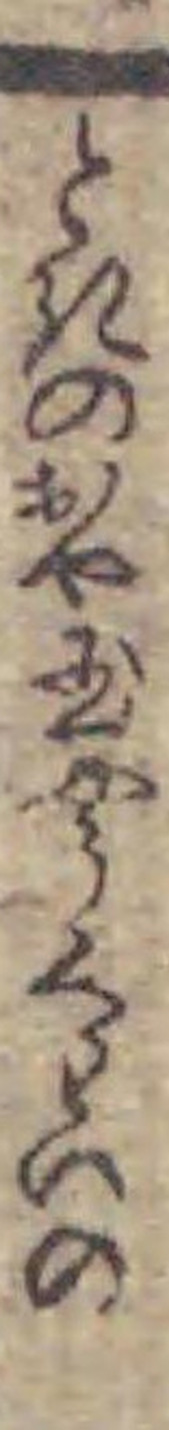ときのおや玉やうくわいの
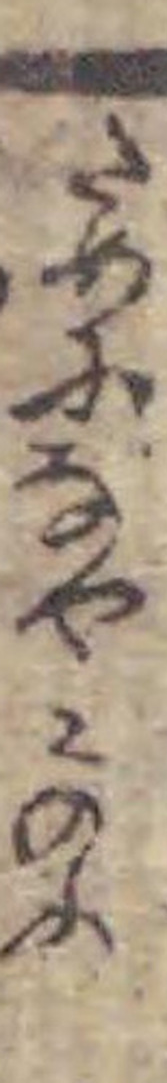ためになやみ給ふ
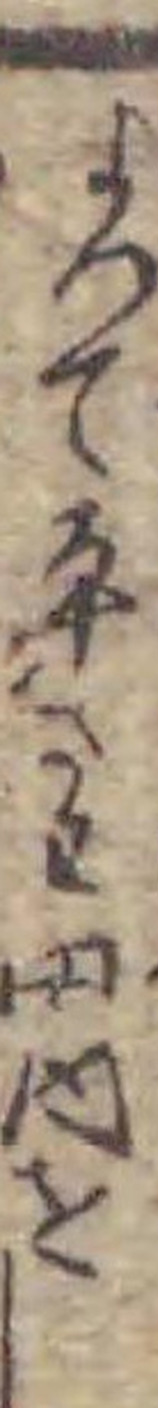よつて平さわ田内を
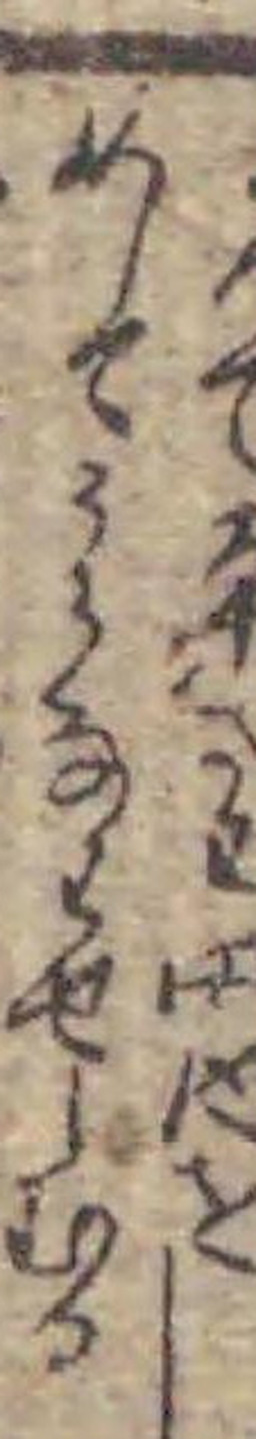めしてうらなわせしむる
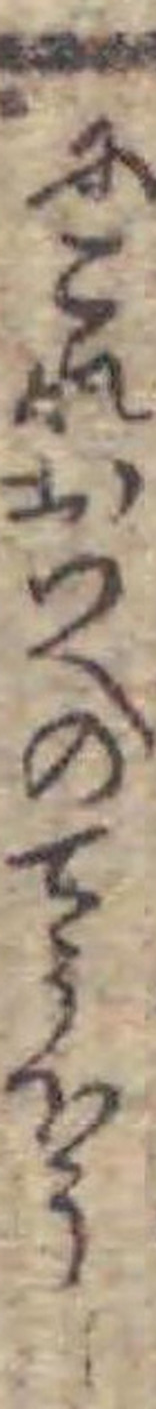にこれおいへのてうほう
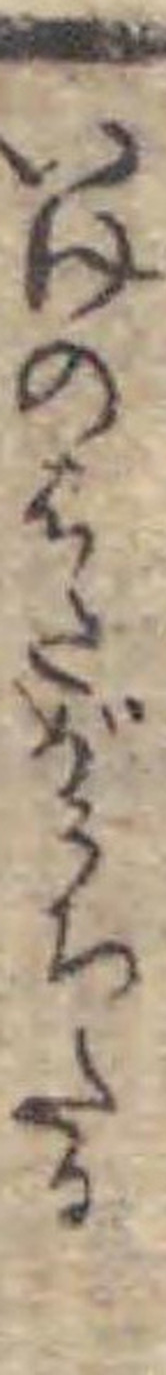いけのはたがうちたる
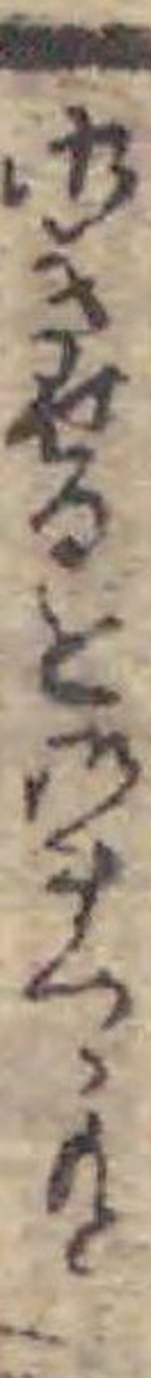御きせるを御まくらもと
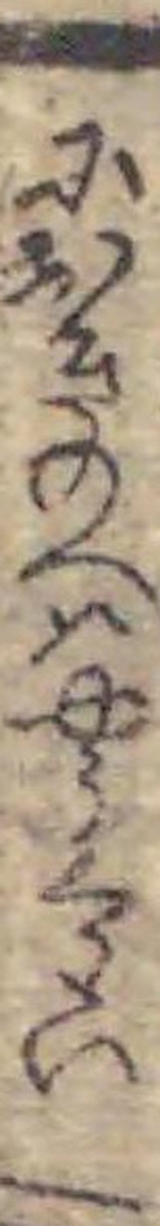におきのへ？はやうくわい
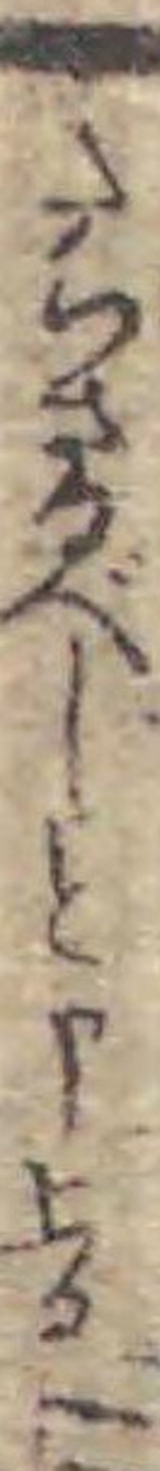たちさるべしと申上る
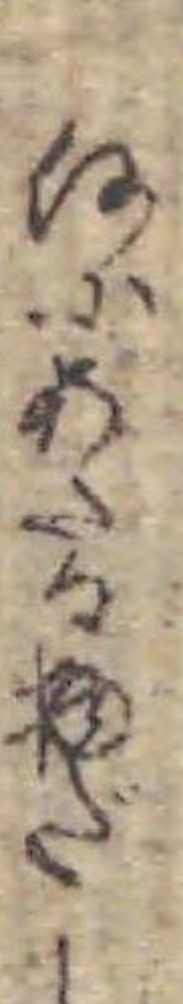何にあたる物だ
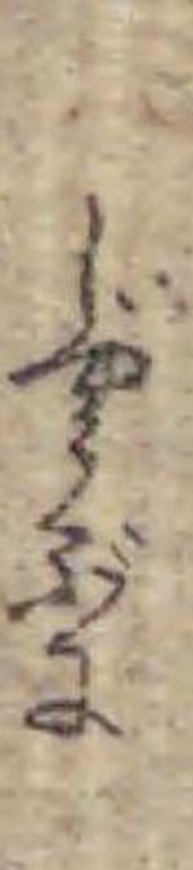じやうぶに
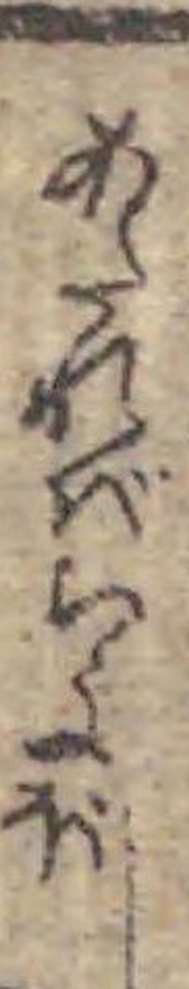あたればちよほ
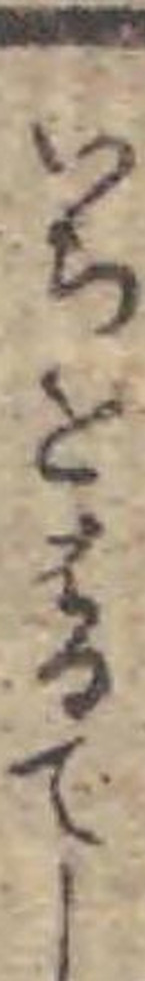いちをはるで
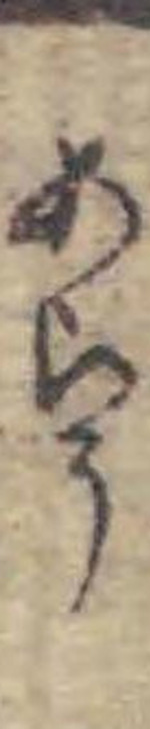あらう
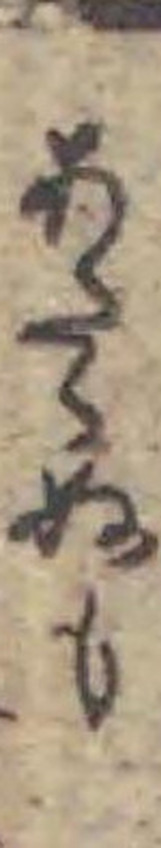あたらぬも
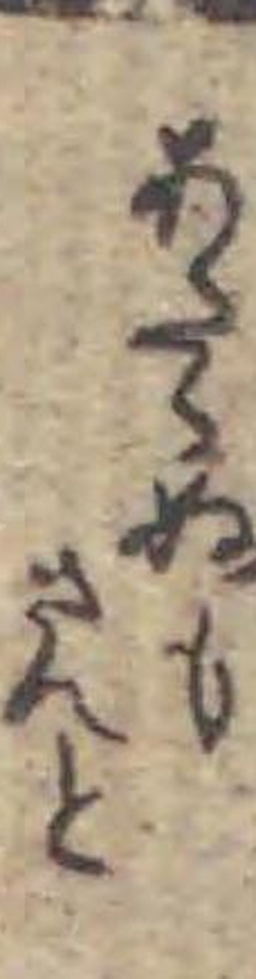さんと
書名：威気千代牟物語 : 2巻
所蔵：国立国会図書館 National Diet Library, JAPAN
